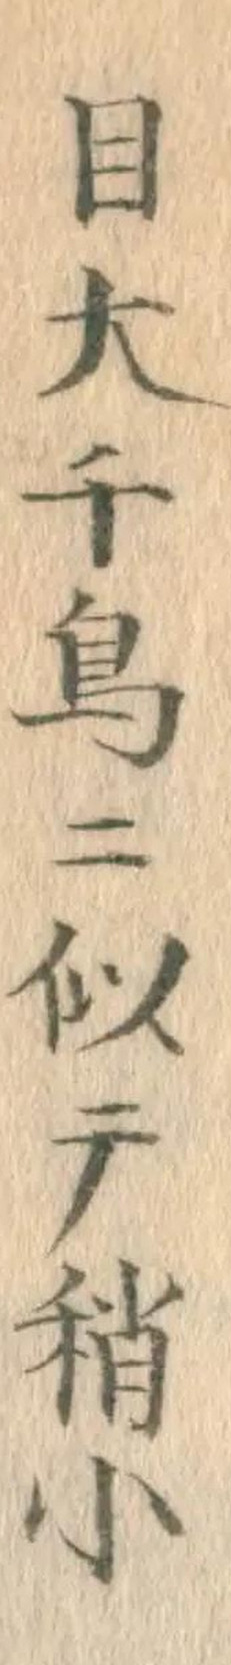目大千鳥ニ似テ稍小
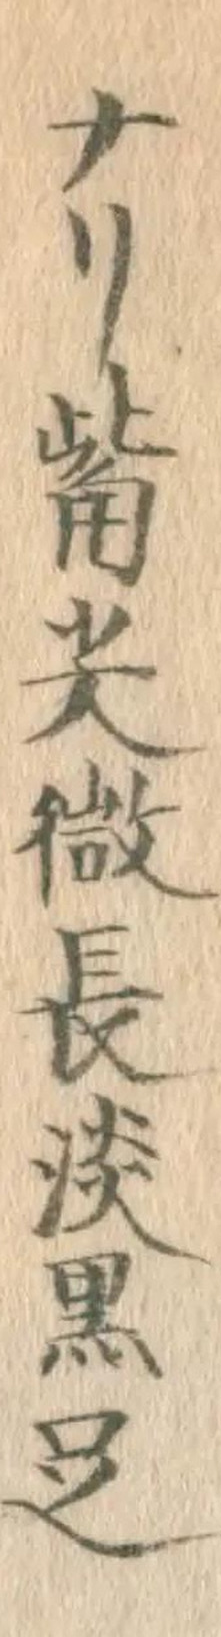ナリ觜光微長淡黒足
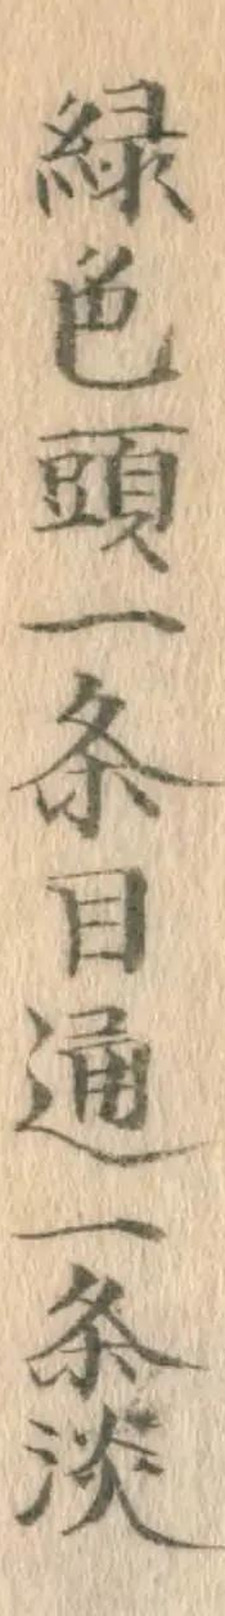緑色頭一条目通一条淡
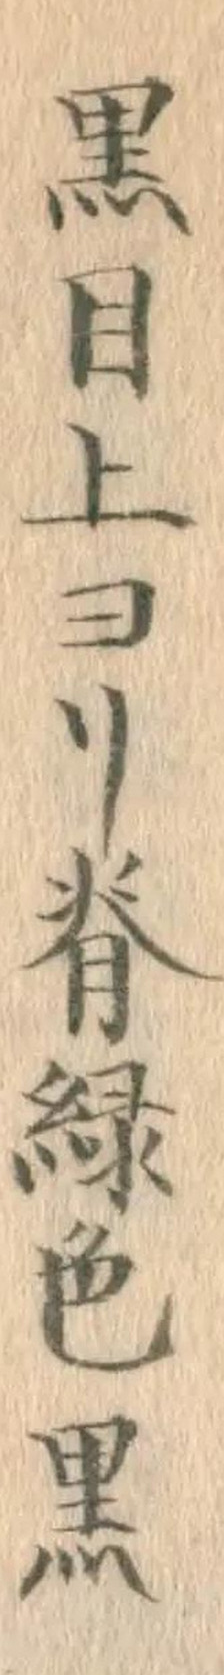黒目上ヨリ脊緑色黒
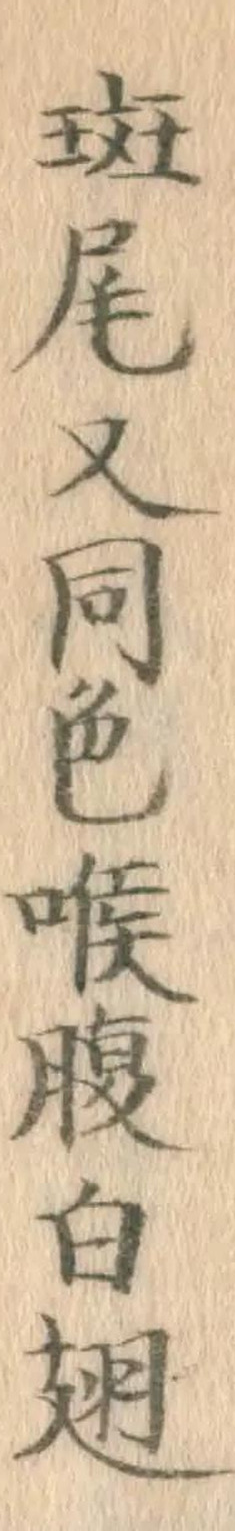斑尾又同色喉腹白翅
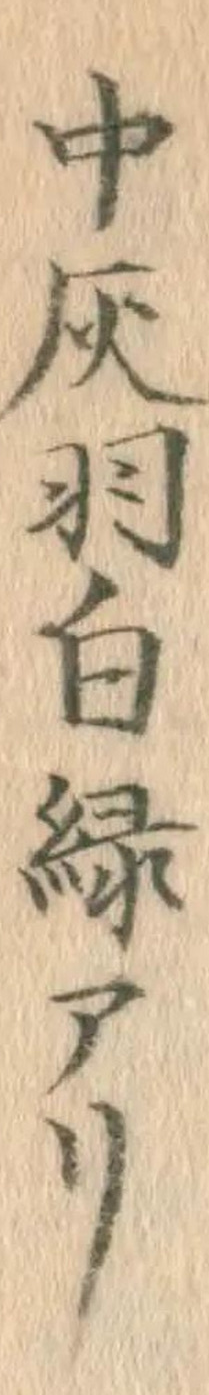中灰羽白縁アリ
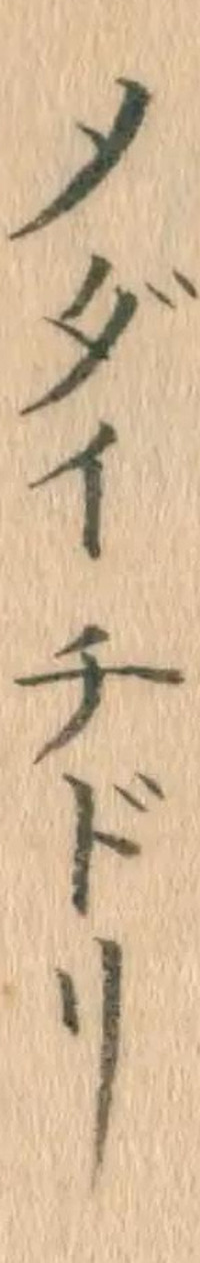メダヒチドリ
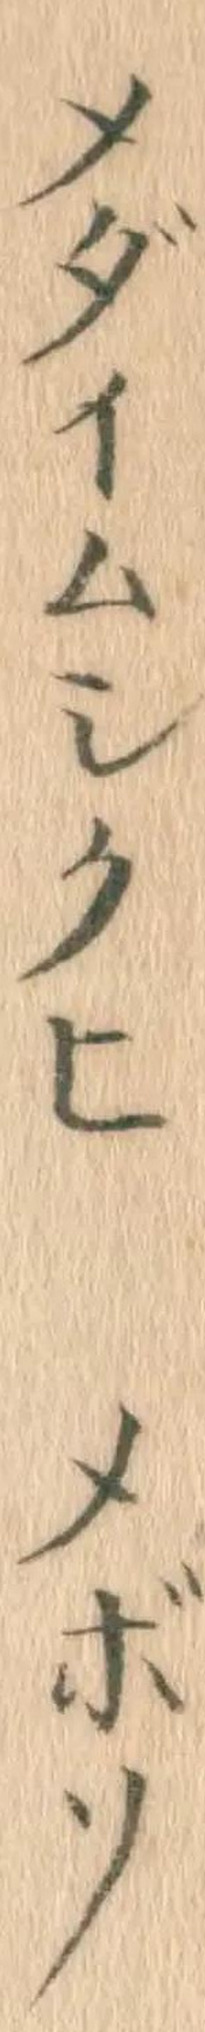メダイムシクヒメボリ
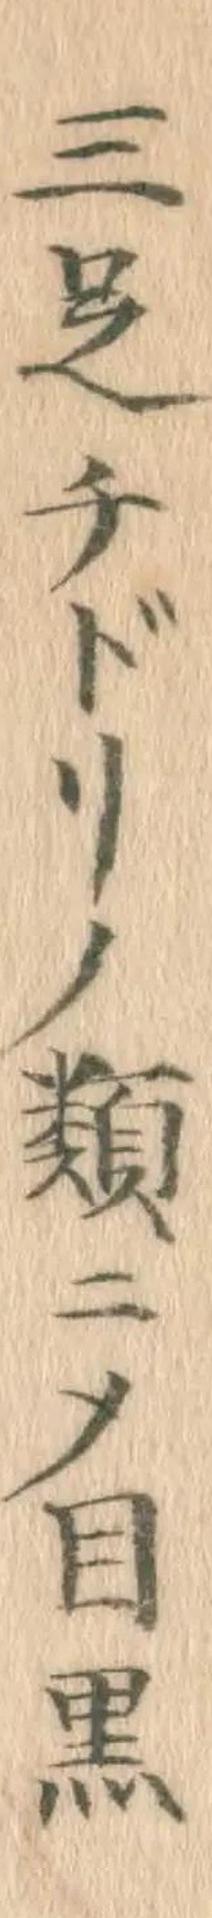三足チドリノ類ニシテ目黒
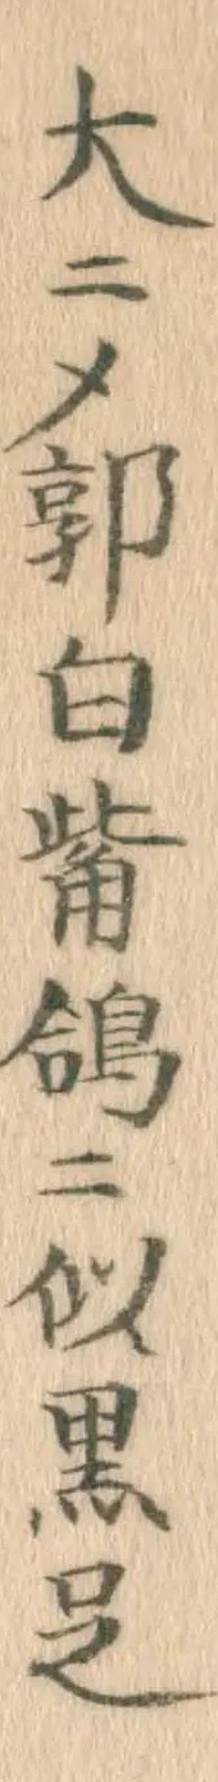大ニシテ郭白觜鴿ニ似黒足
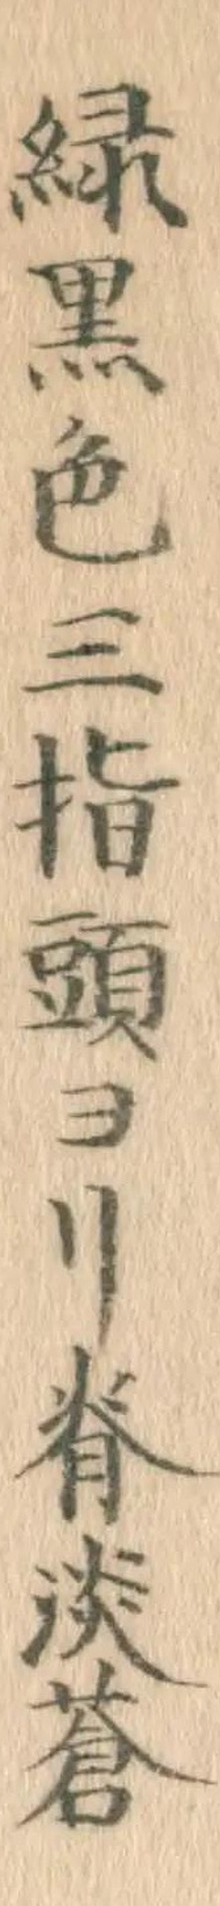縁栗色三指頭ヨリ脊淡蒼
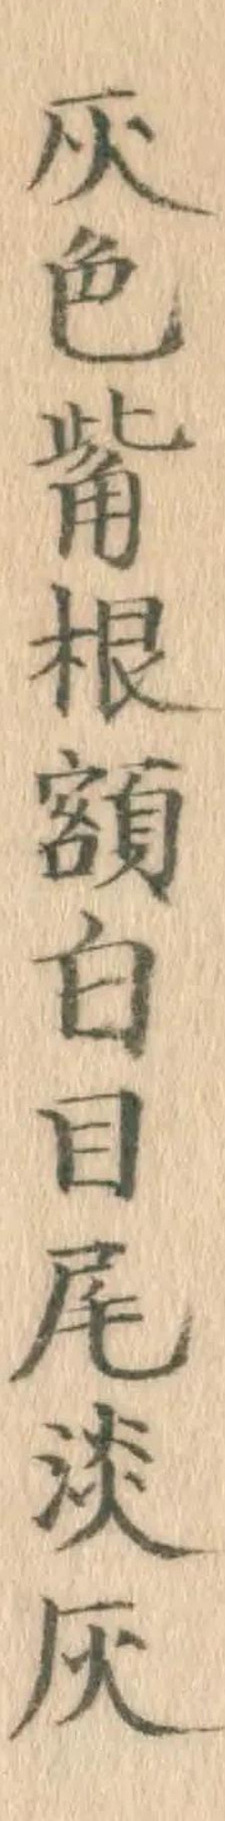灰色觜根額白目尾淡灰
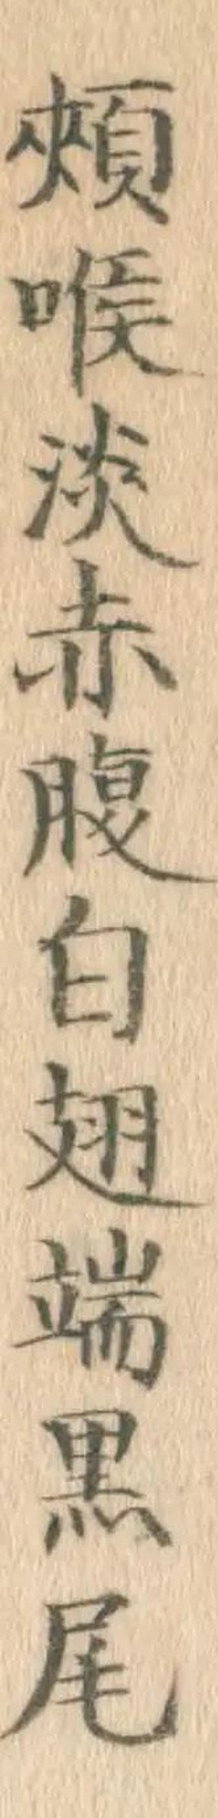頬喉淡赤腹白翅端黒尾
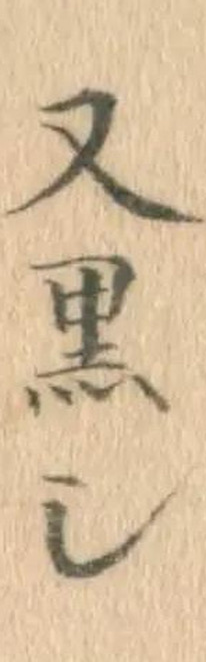又黒シ

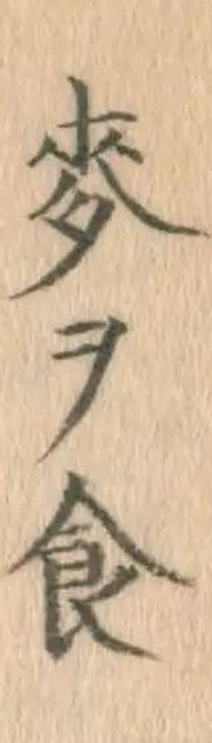麦ヲ食

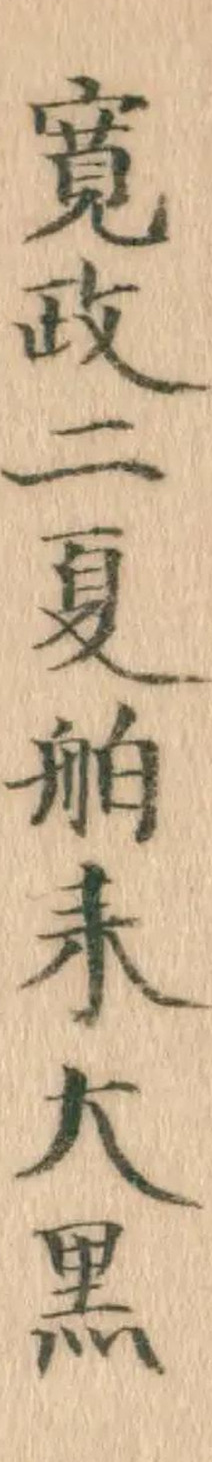寛政二夏舶来大黒
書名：水谷禽譜. [2]
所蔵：国立国会図書館 National Diet Library, JAPAN
